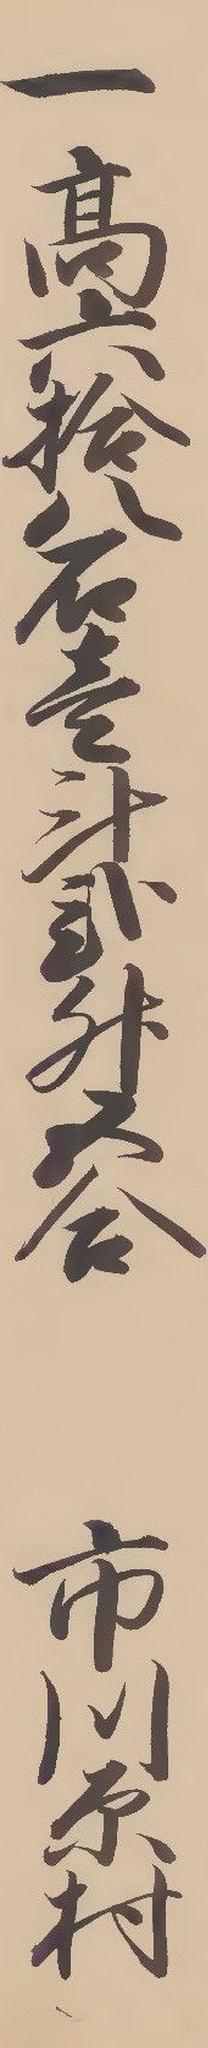一高六拾八石壱斗弐升五合市川原村

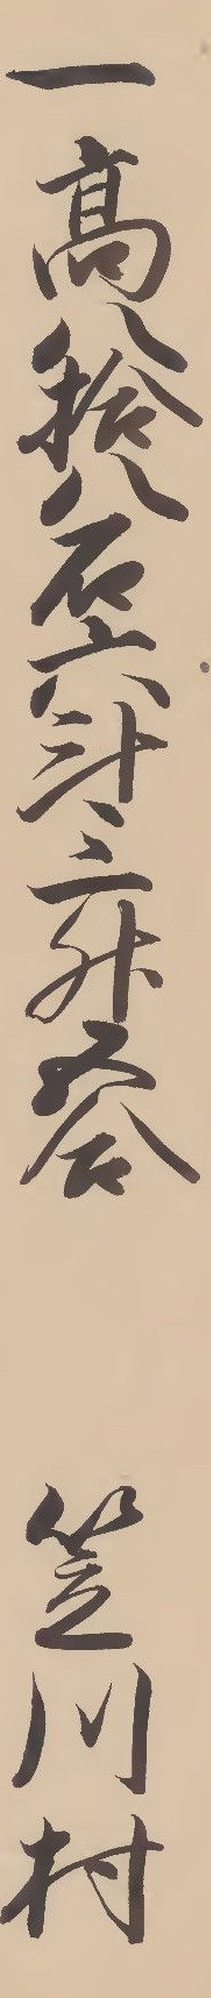一高八拾八石六斗三升五合笠川村
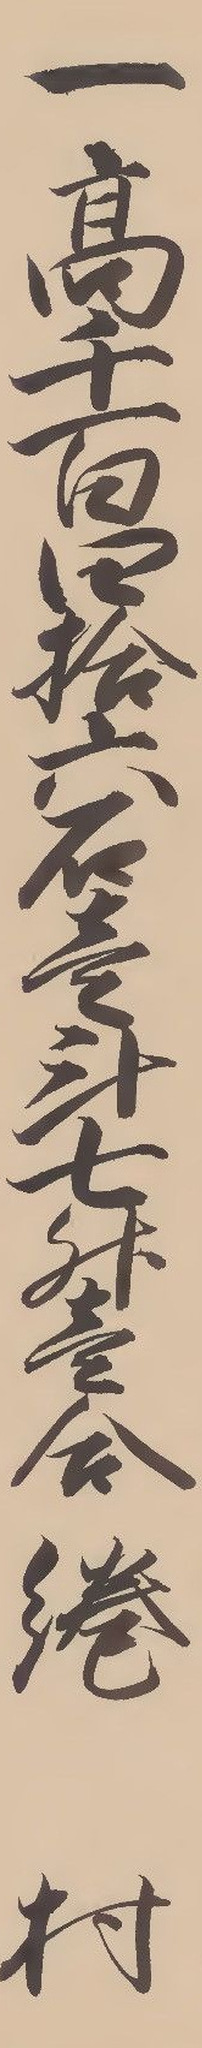一高千百四拾六石壱斗七升壱合綣村
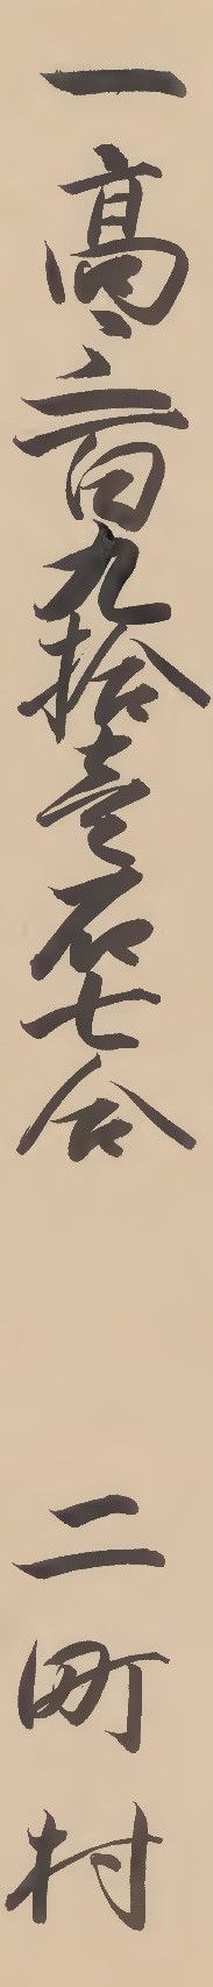一高三百九拾壱石七合二町村
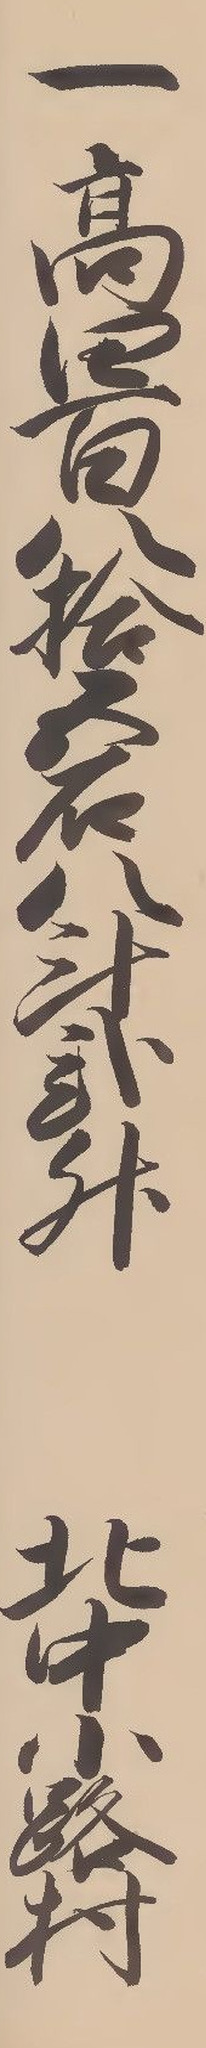一高四百八拾五石八斗弐升北中小路村
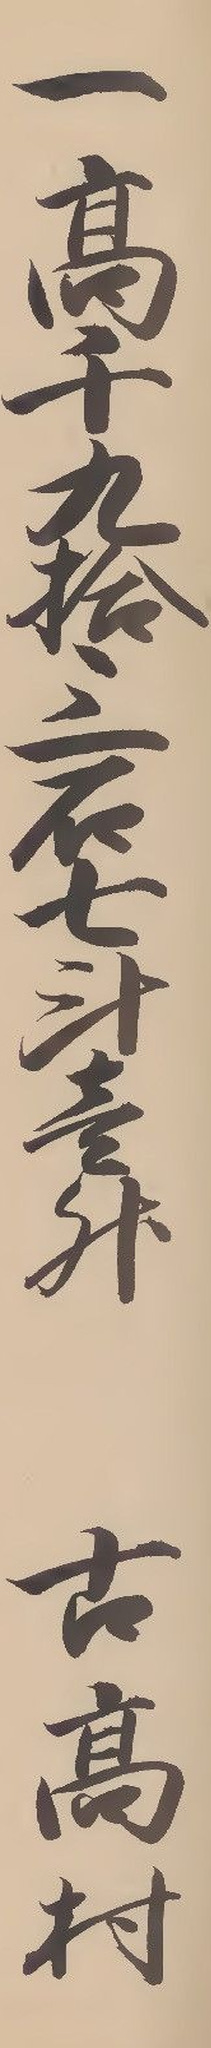一高千九拾三石七斗壱升古高村
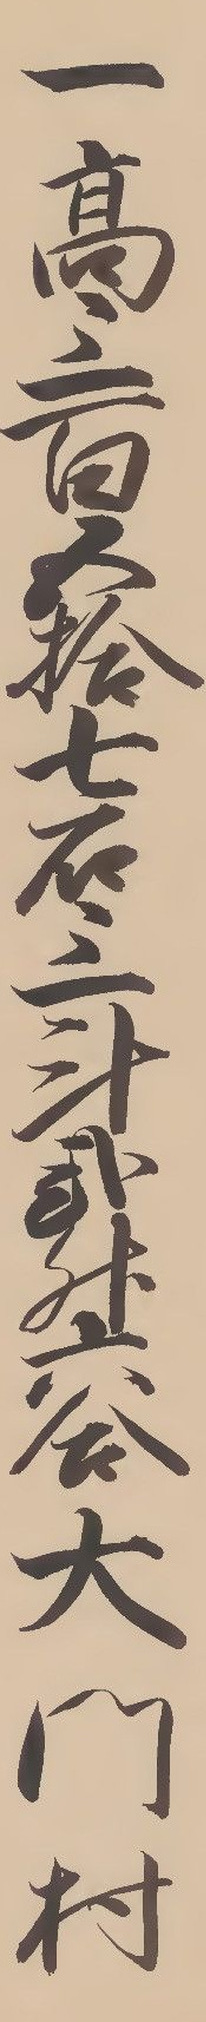一高三百五拾七石三斗弐升六合大門村
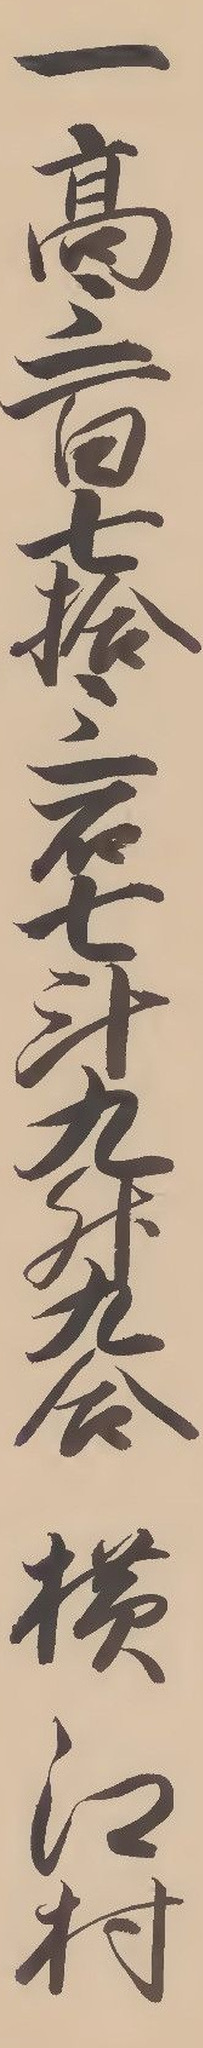一高三百七拾三石七斗九升九合横江村

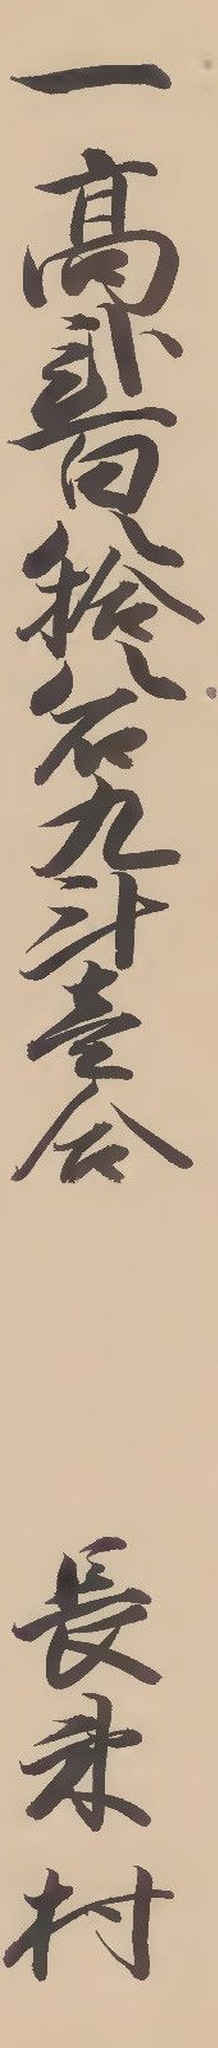一高弐百八拾八石九斗壱合長束村
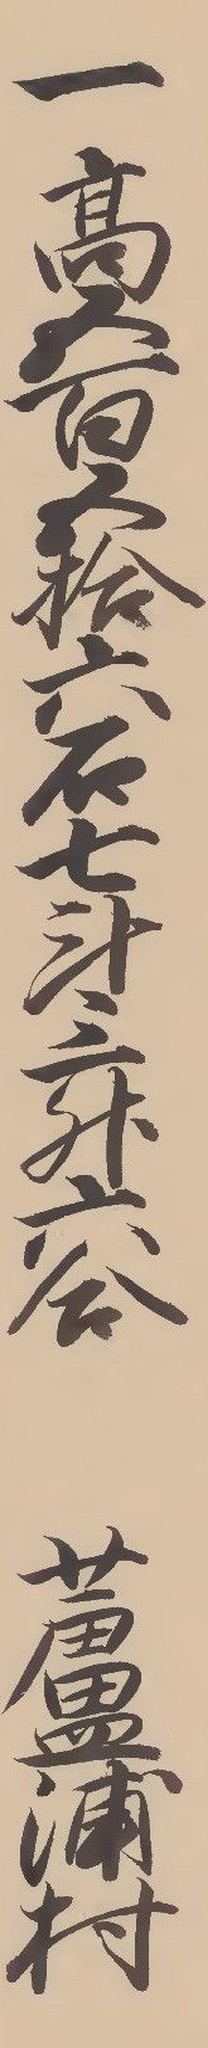一高五百五拾六石七斗三升六合蘆浦村
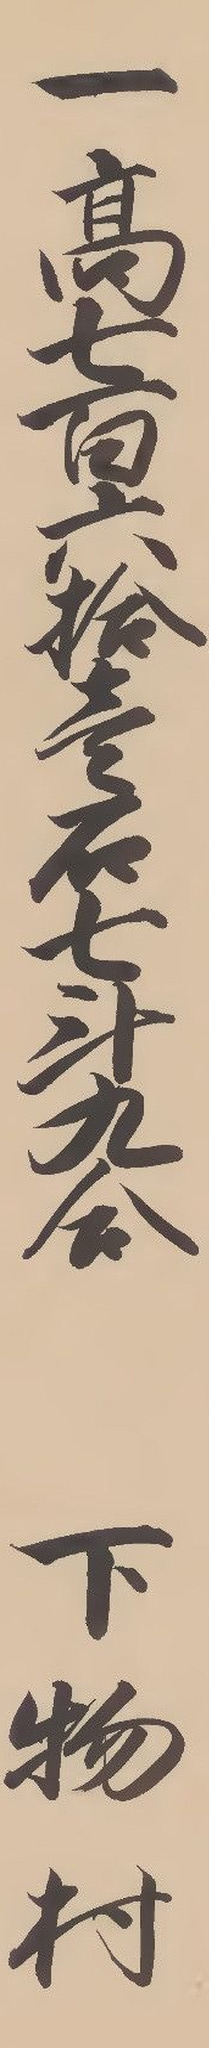一高七百六拾壱石七斗九合下物村
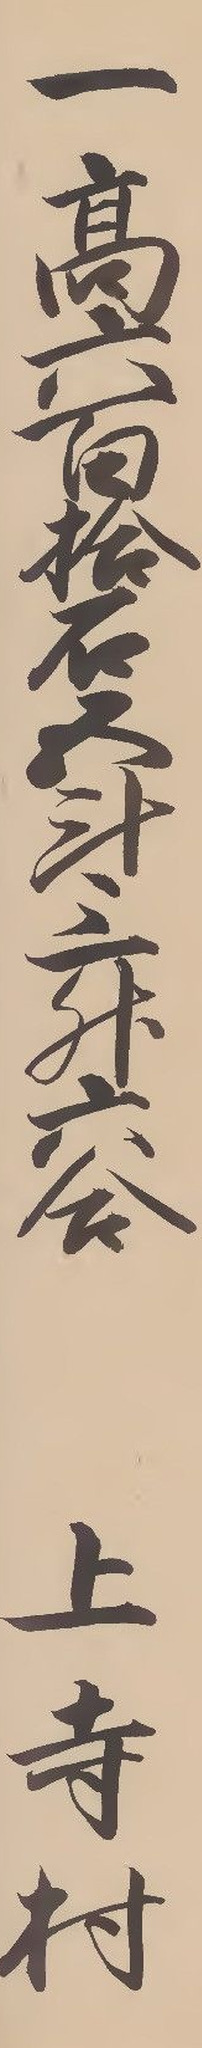一高六百拾石五斗三升六合上寺村
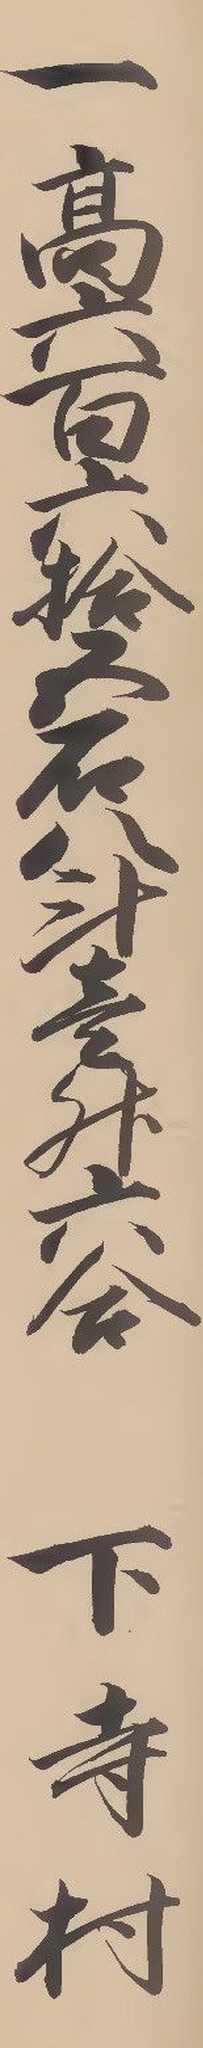一高六百六拾五石八斗壱升六合下寺村
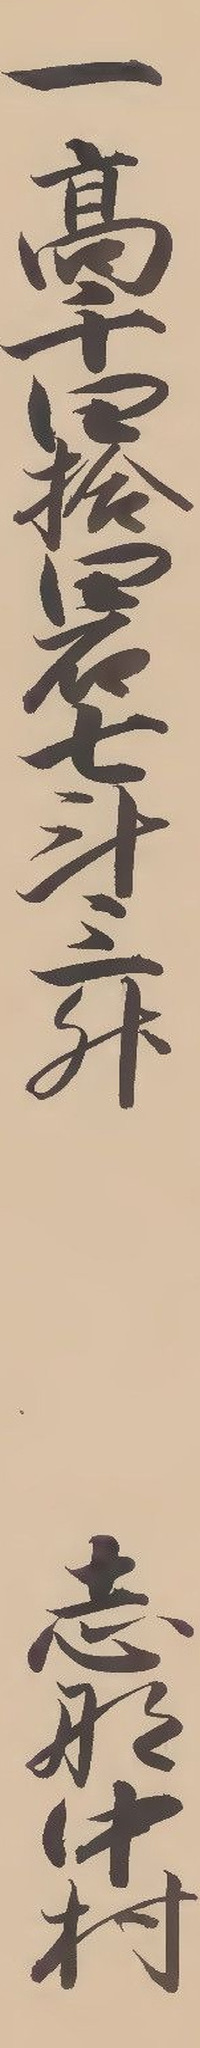一高千四拾四石七斗三升志那中村
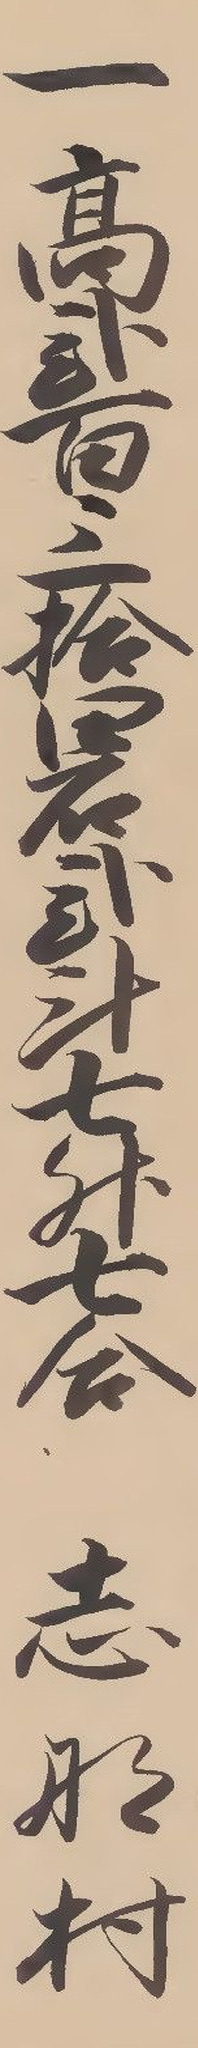一高弐百三拾四石弐斗七升七合志那村
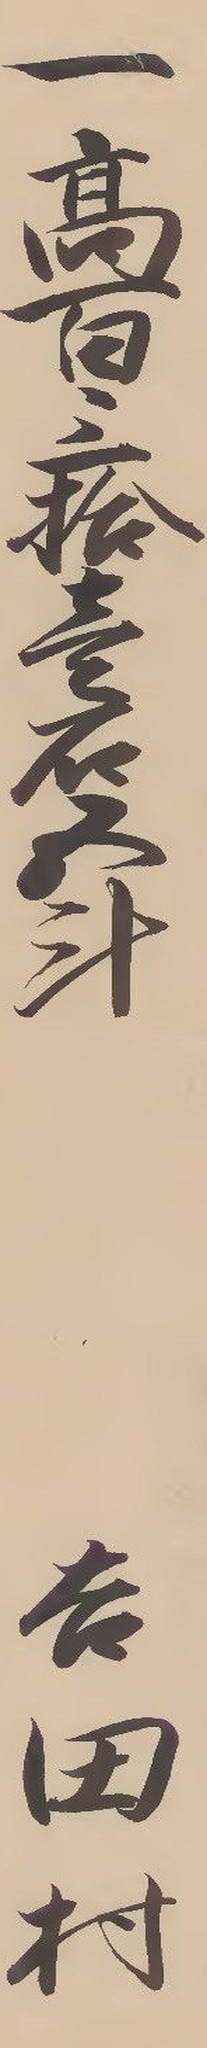一高百三拾壱石五斗吉田村
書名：近江国郷帳
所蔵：国立公文書館 National Archives of Japan
